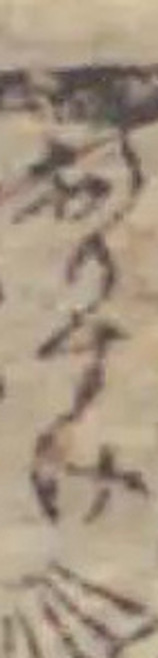おりすけ
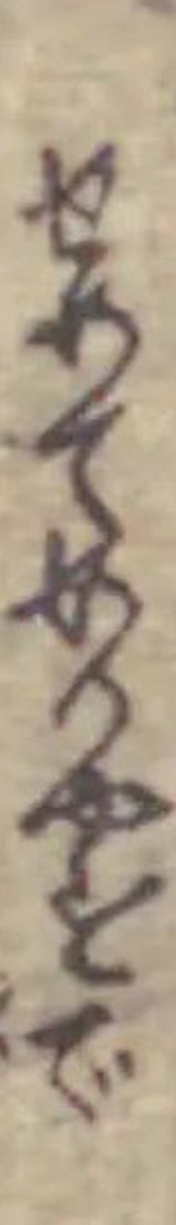せめてめりやすで
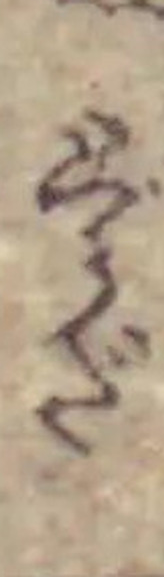どうだ
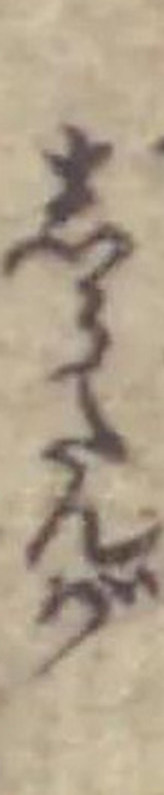しうたんが
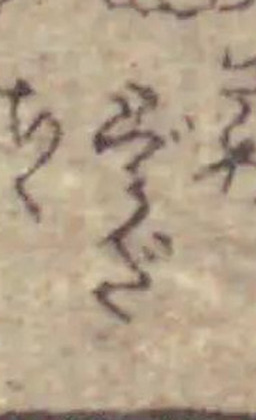どうだ
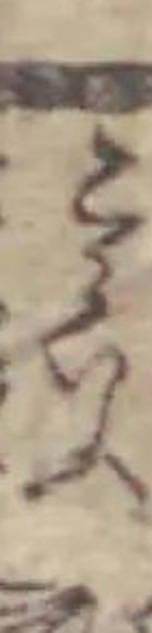こういふ
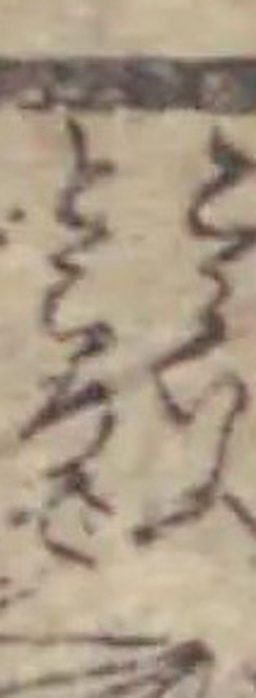ところで
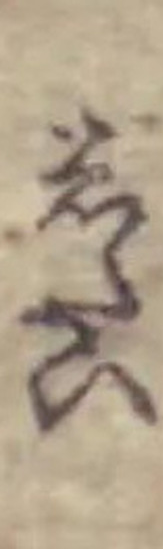したい
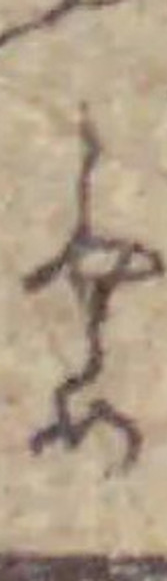しやうめ
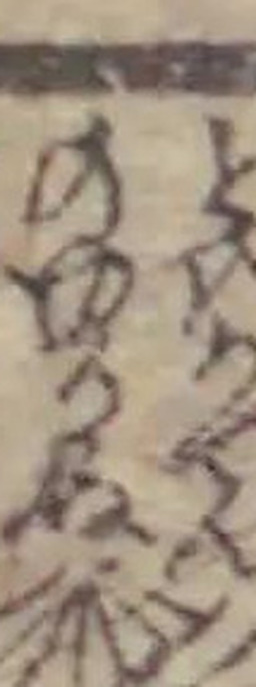もゆかぬ
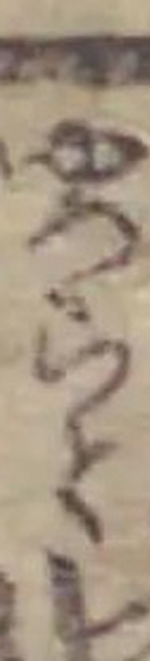やつらと
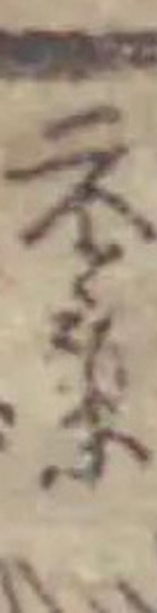二人ともに
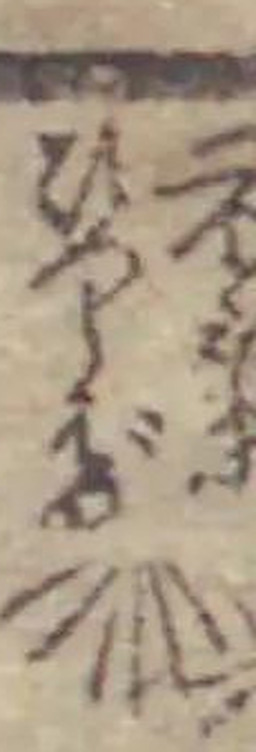ひつしばる

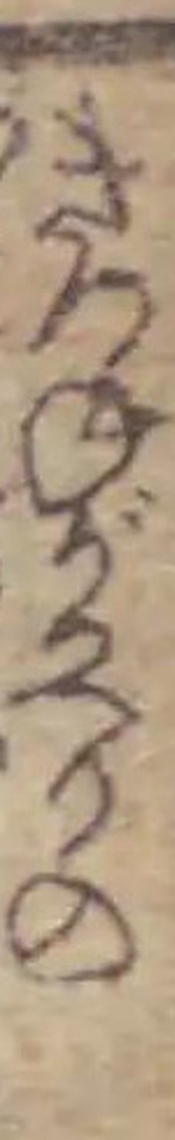きつねがかへりの
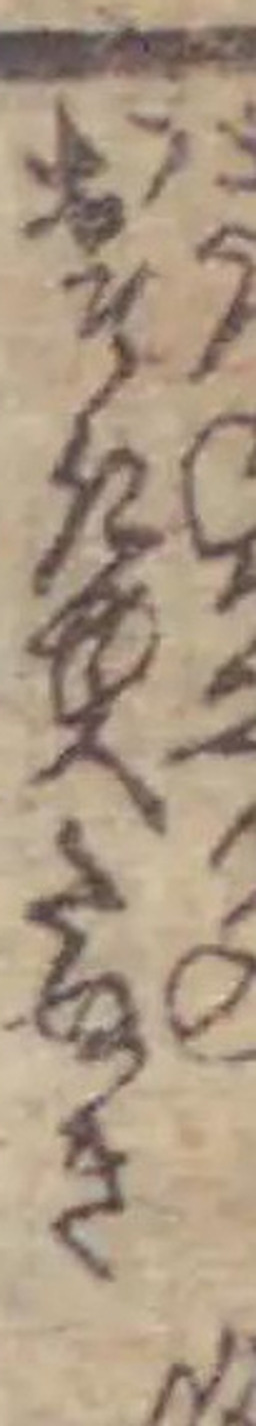おそきゆへたぬき
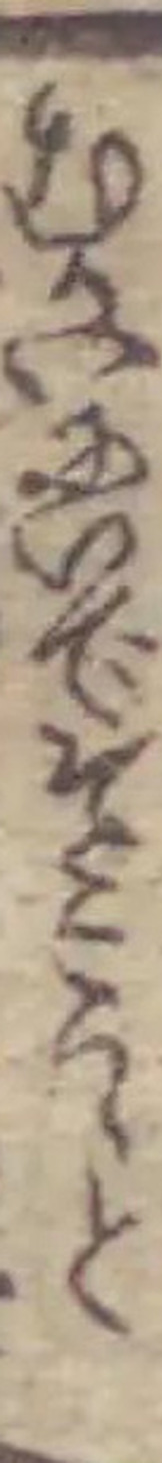むかいにいでそここゝと
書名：化物昼寝鼾 2巻
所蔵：国立国会図書館 National Diet Library, JAPAN
